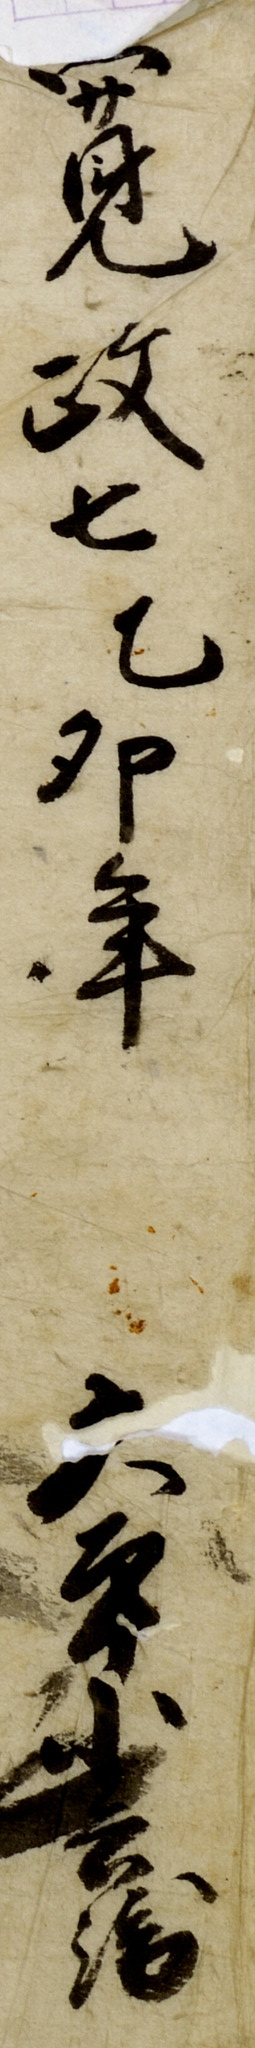寛政七乙卯年六茂小兵衛
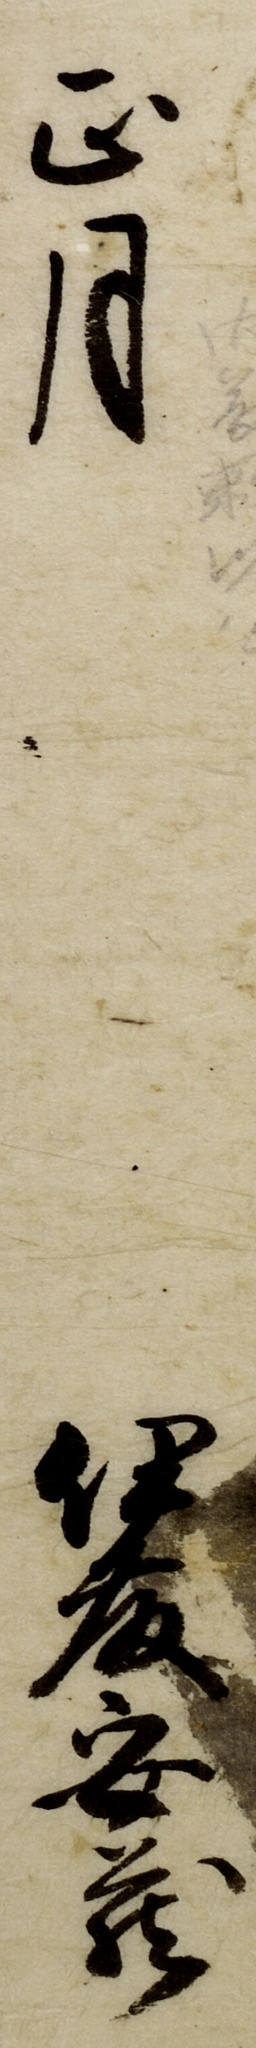正月伊藤安蔵

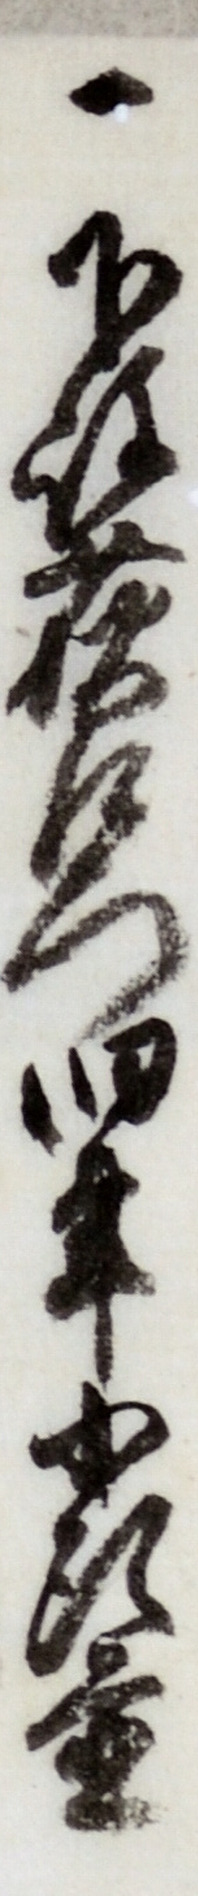下役萩左衛門旧年小頭並
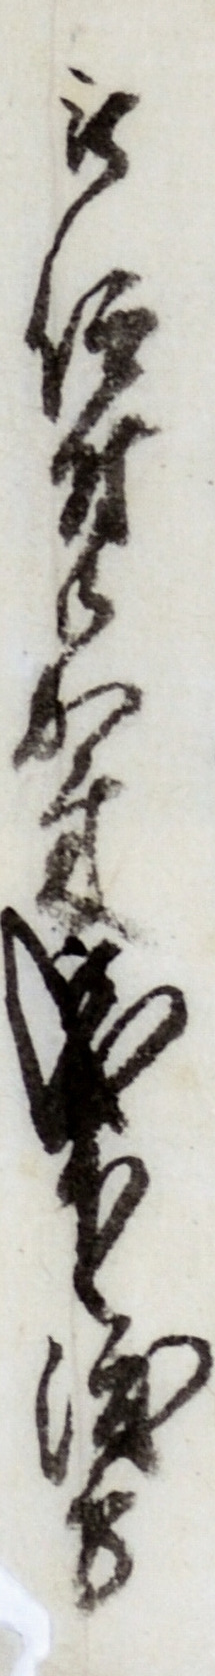被仰付御加米被成下候渡方
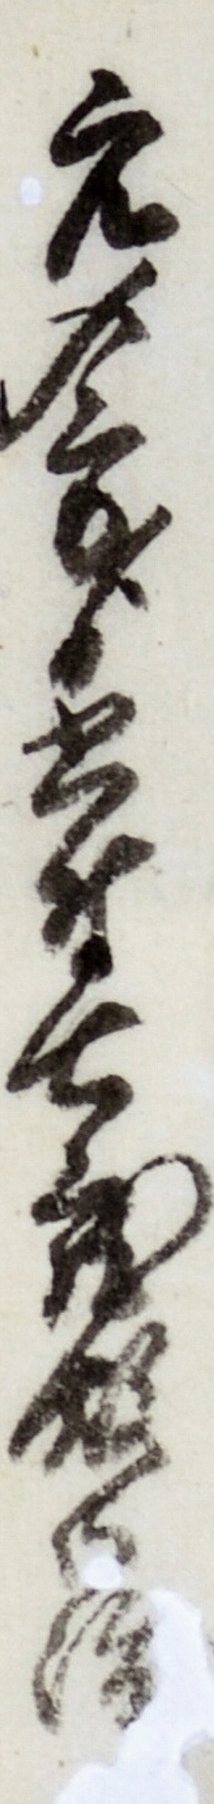元〆方より書付七蔵殿御渡
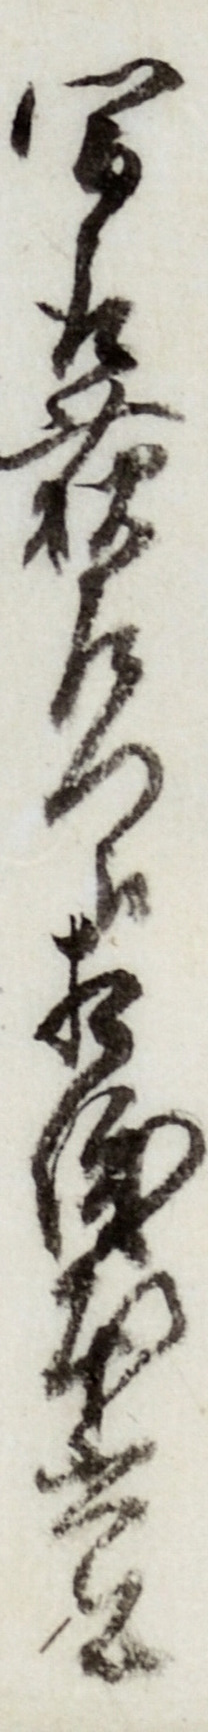写取萩左衛門え相渡本書者
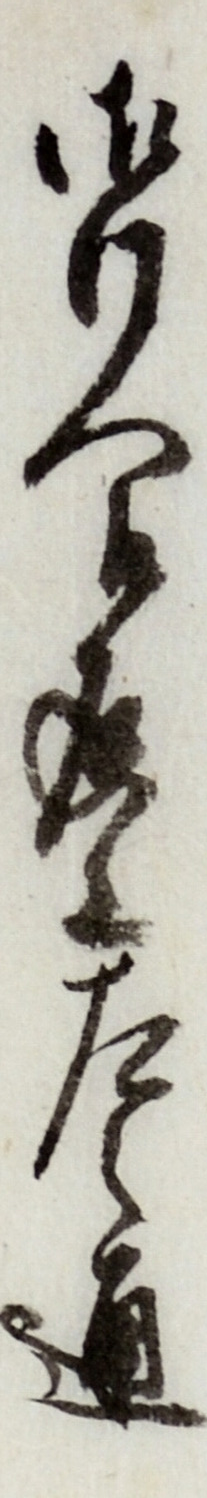御同人え返上左之通
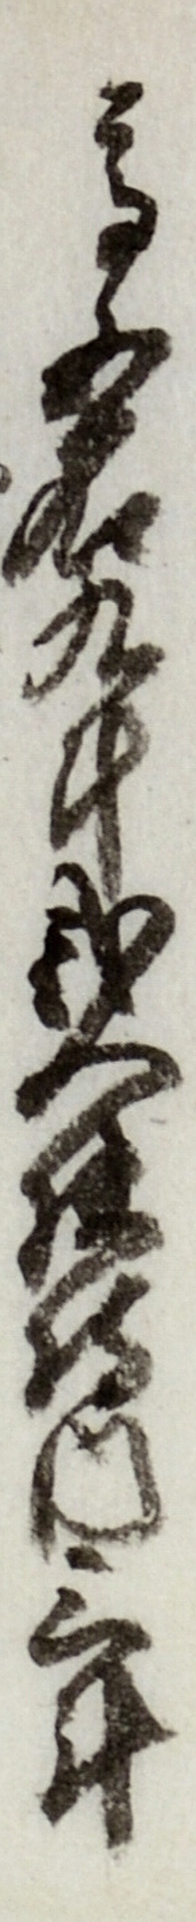高五石九斗弐人扶持内三斗
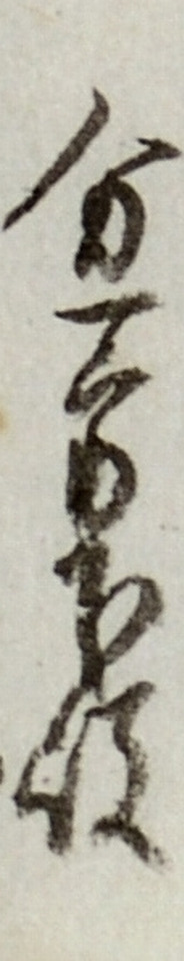分一方下役
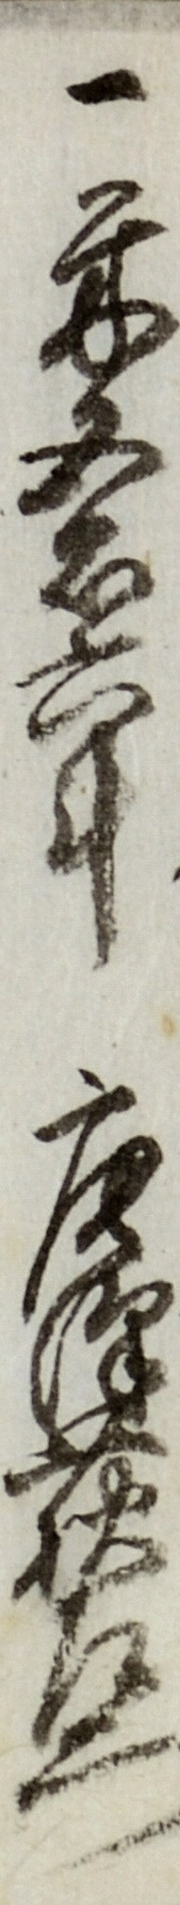一米五石六斗唐沢萩左衛門
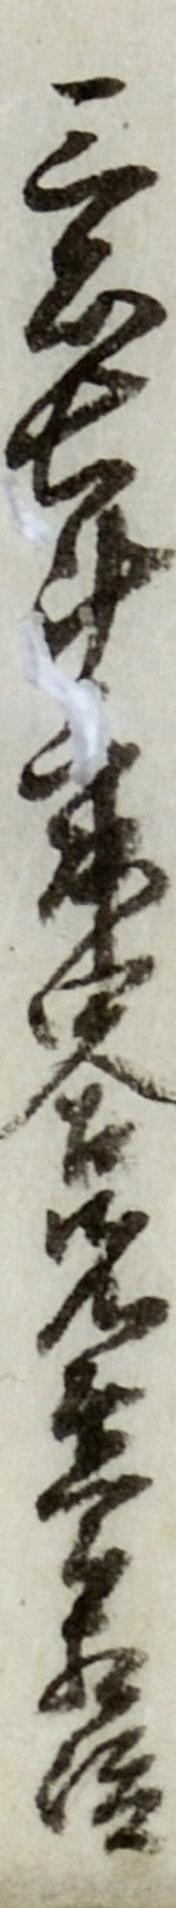三石七斗三升四合先達而相渡
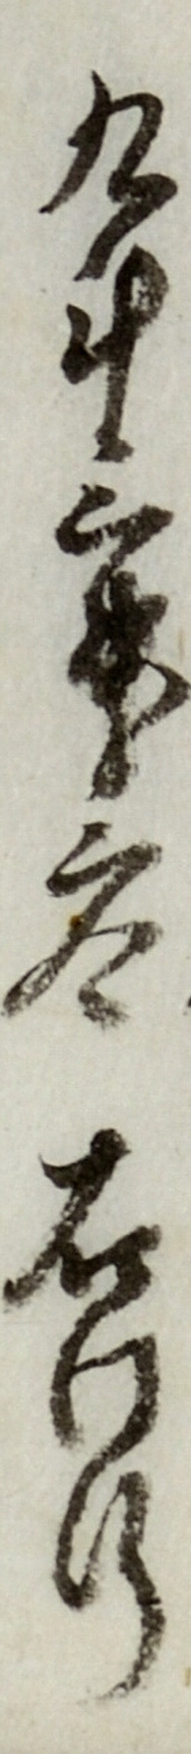九斗三升三合右同断
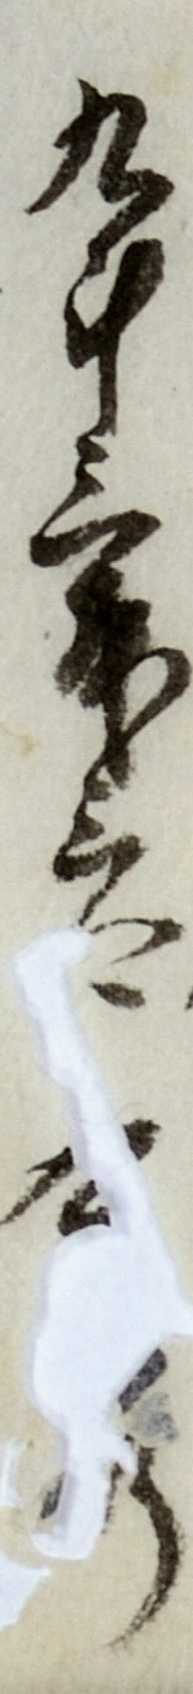九斗三升三合右同断
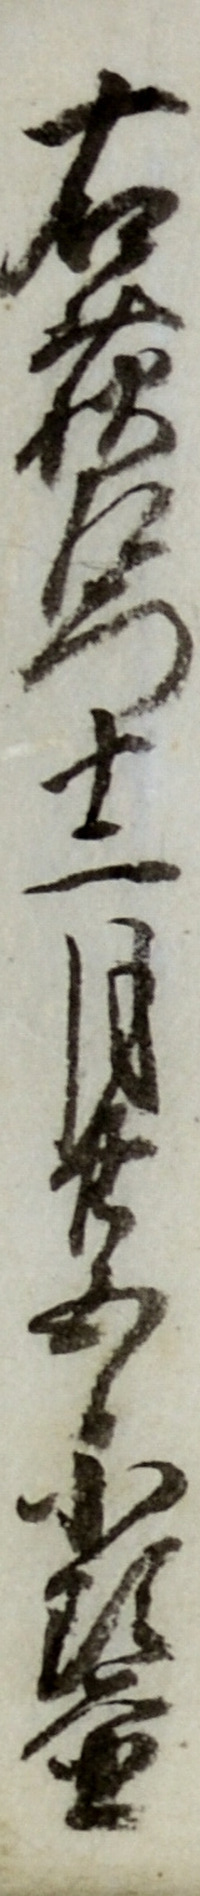右萩左衛門十二月廿五日小頭並
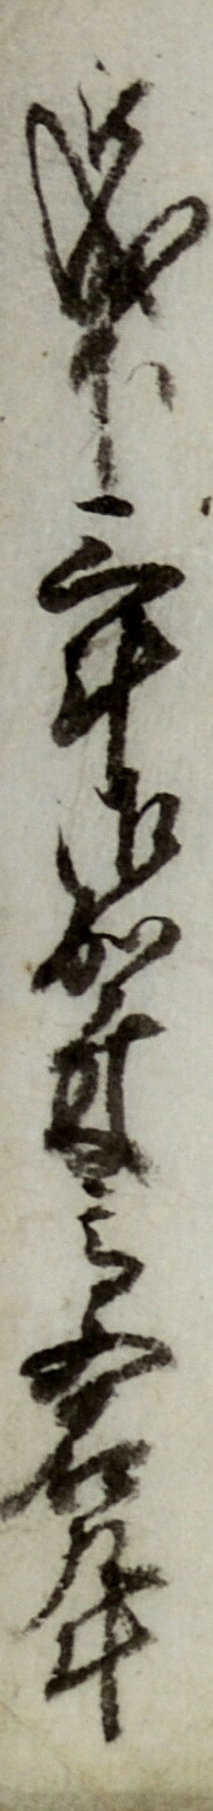被成下三斗御加米高五石九斗

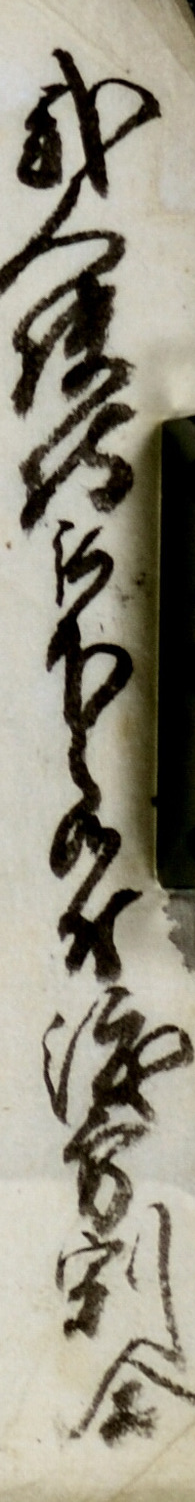弐人扶持被下之候付渡方割合
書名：諸事御用留帳
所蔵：伊那市立高遠町図書館・合同会社AMANE
